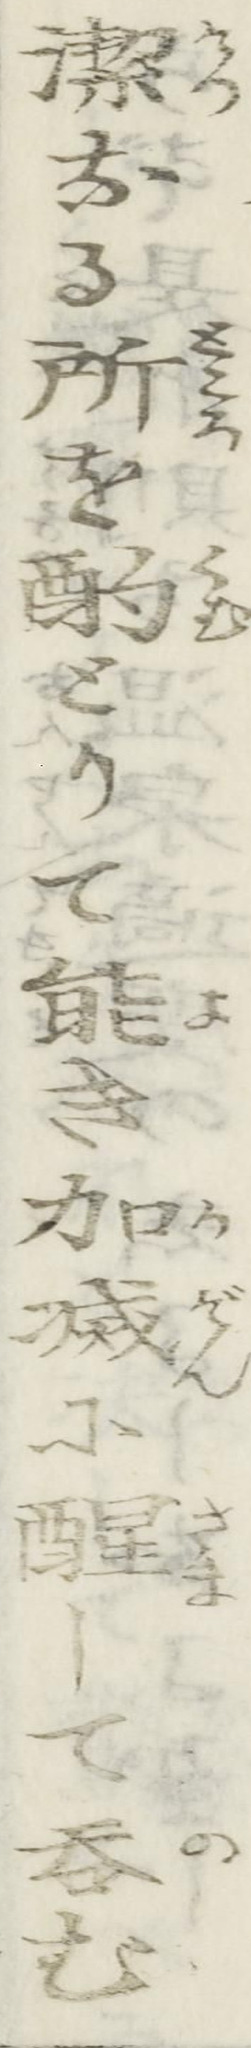潔なる所を酌とりて能き加減に醒して呑む
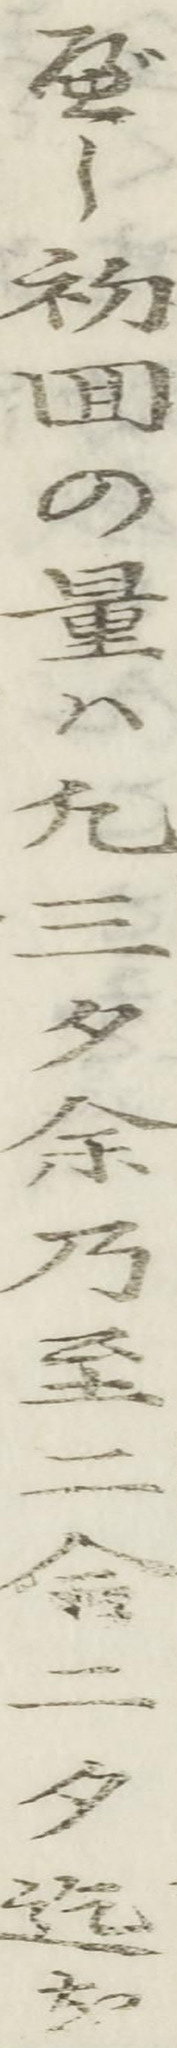べし初回の量は凡三夕余乃至二合二夕迄は
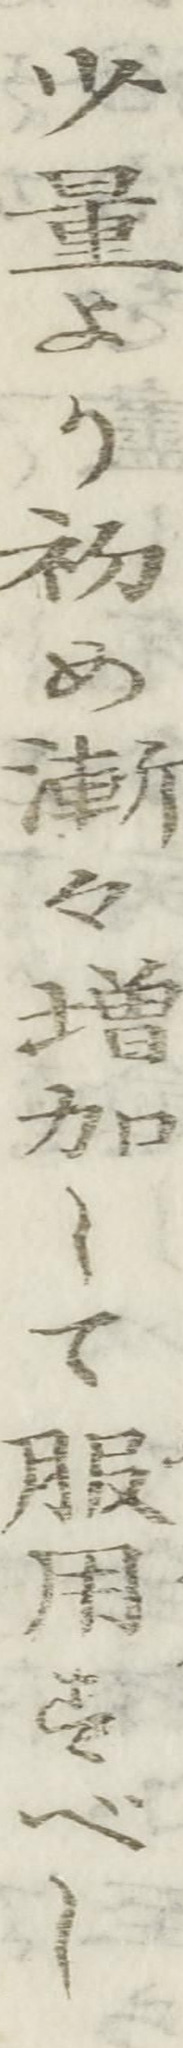少量より初め漸々増加して服用すべし
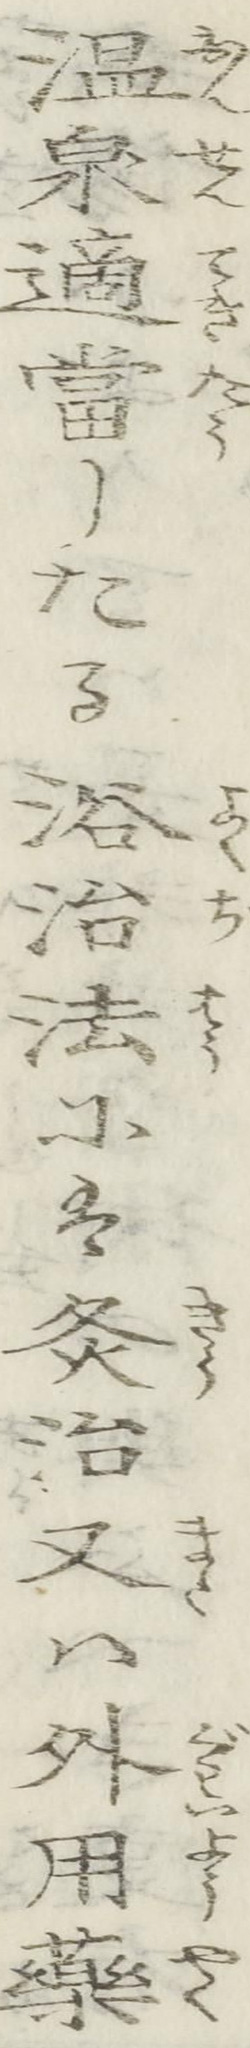温泉適当したる浴治法には灸治又は外用薬
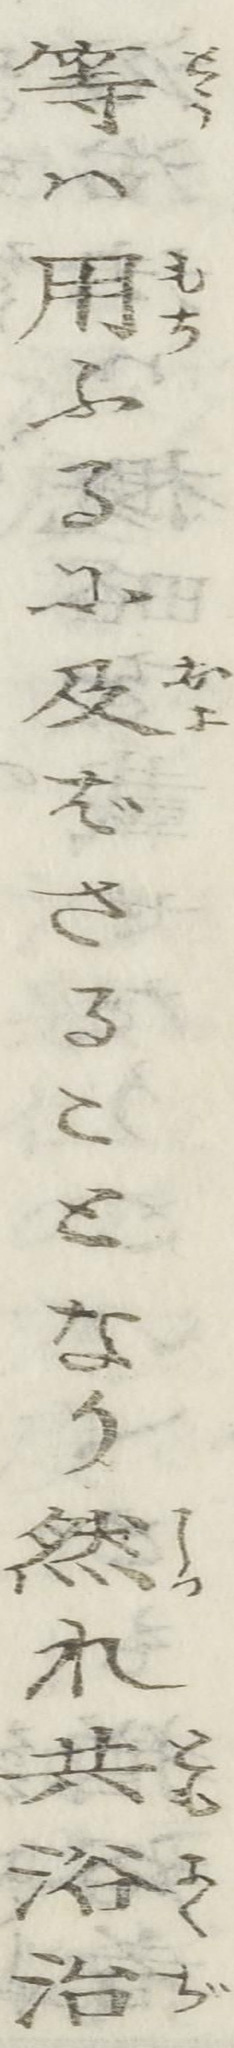等は用ふるに及ばざることなり然れ共浴治
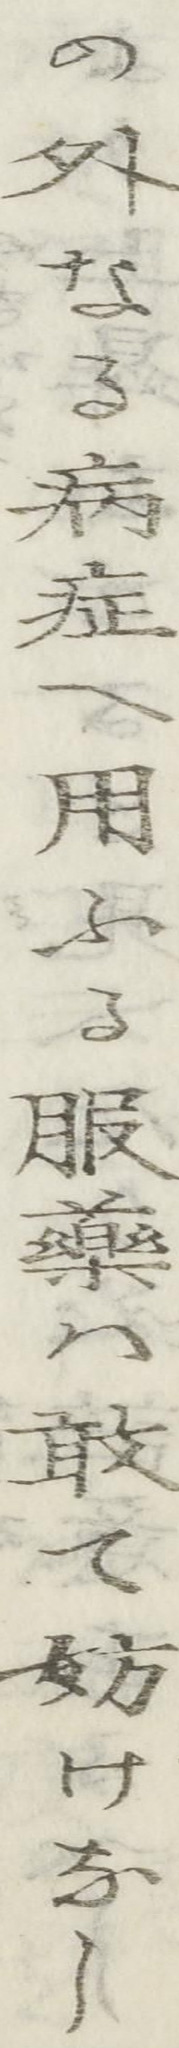の外なる病症へ用ふる服薬は敢て妨けなし
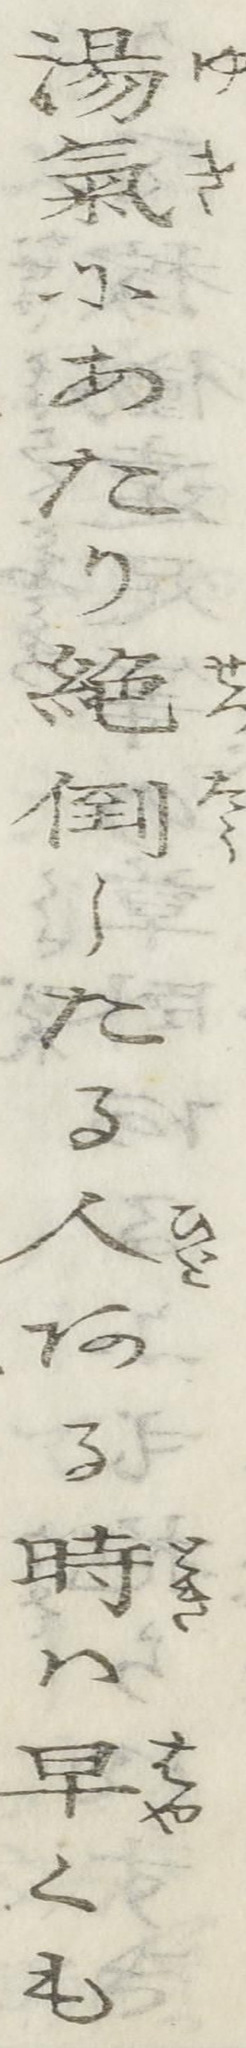湯気にあたり絶倒したる人ある時は早くも
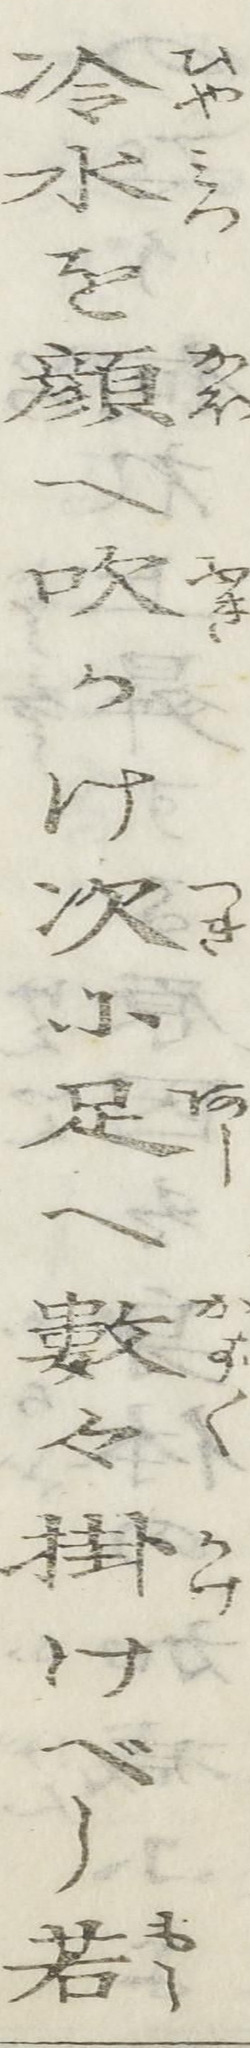冷水を顔へ吹かけ次に足へ数々掛けべし若
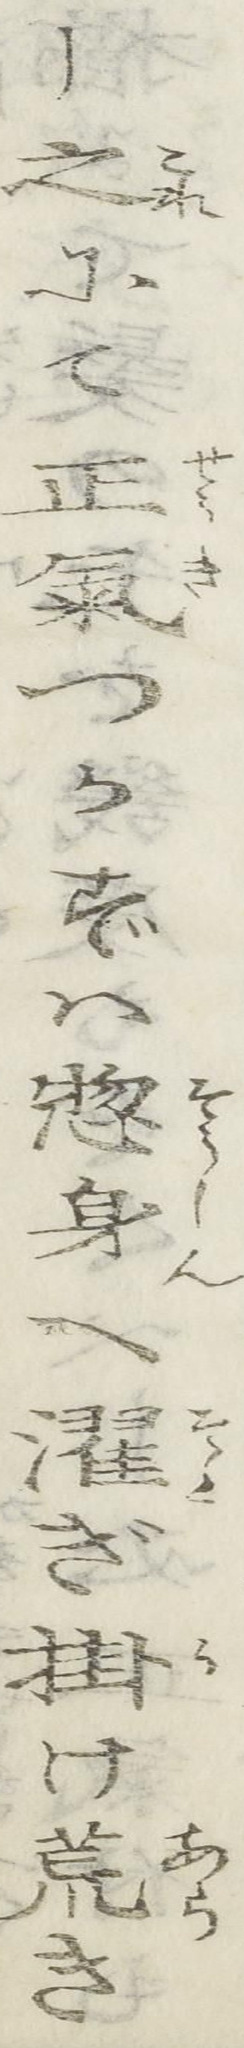し之には正気つかずは総身へ濯ぐ掛け荒き

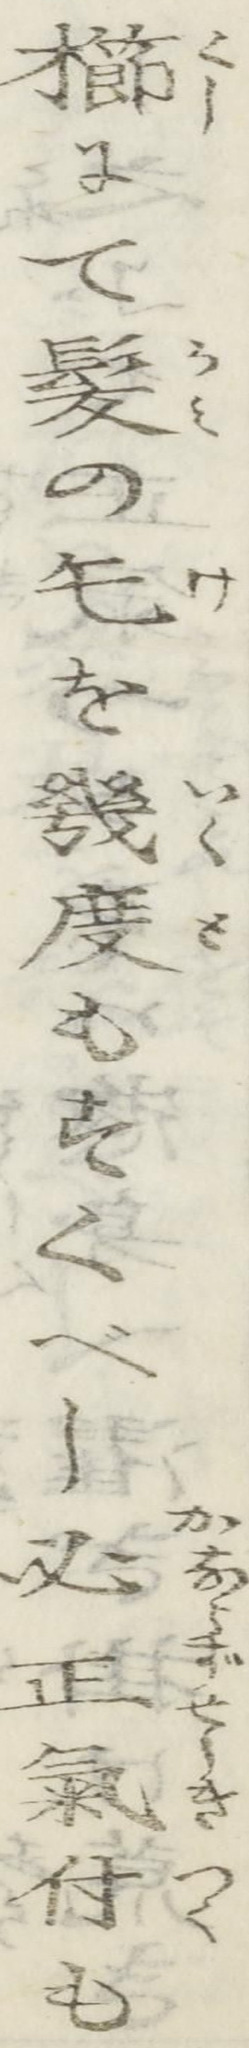櫛にて髪の毛を幾度もすくべし必正気付も
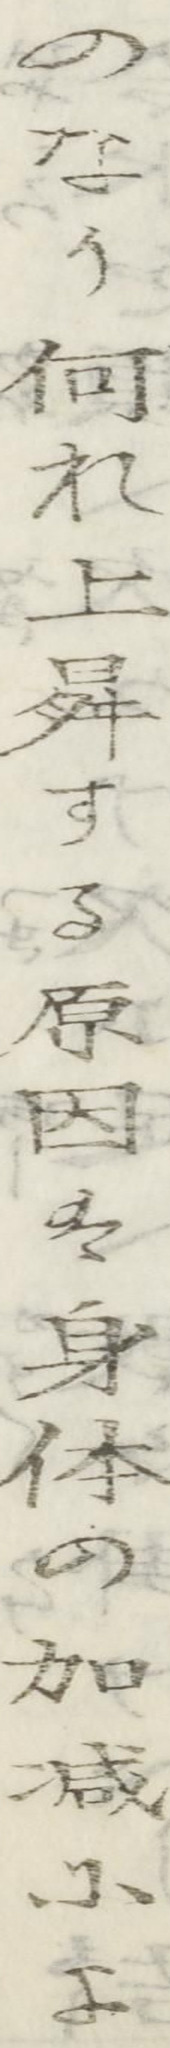のなり何れ上昇する原因は身体の加減によ
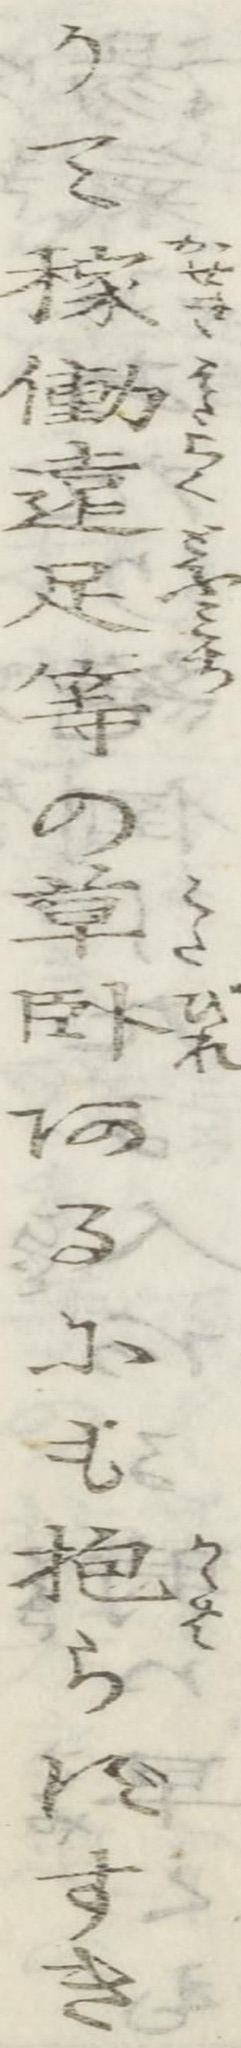りて稼働遠足等の草臥あるにも抱らずすき
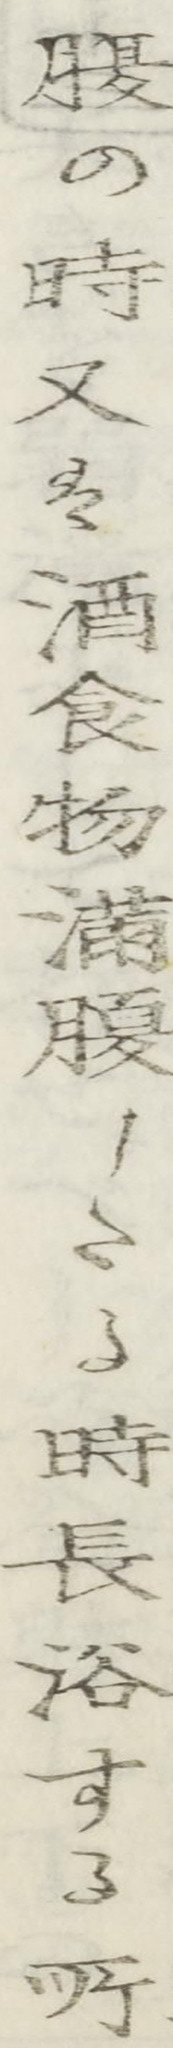腹の時又は酒食物満腹したる時長浴する所
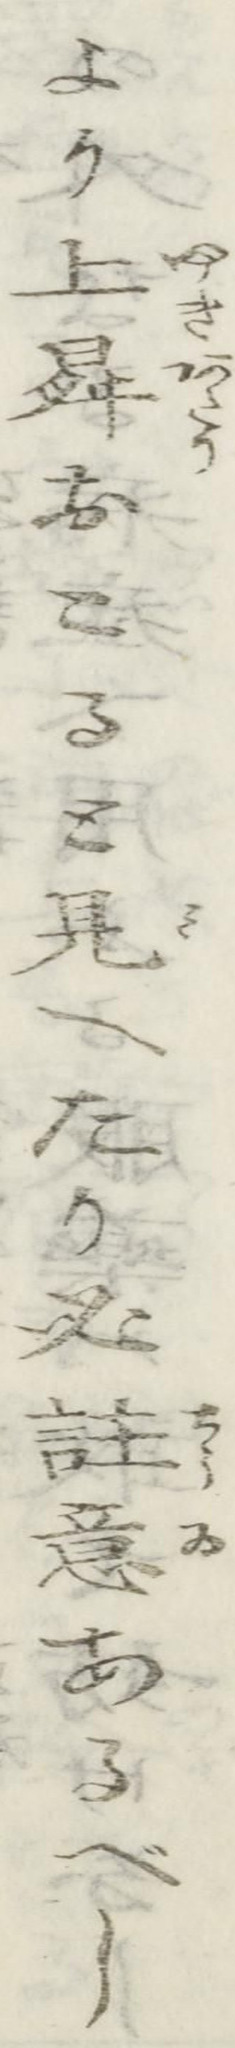より上昇おこると見へたり必註意あるべし
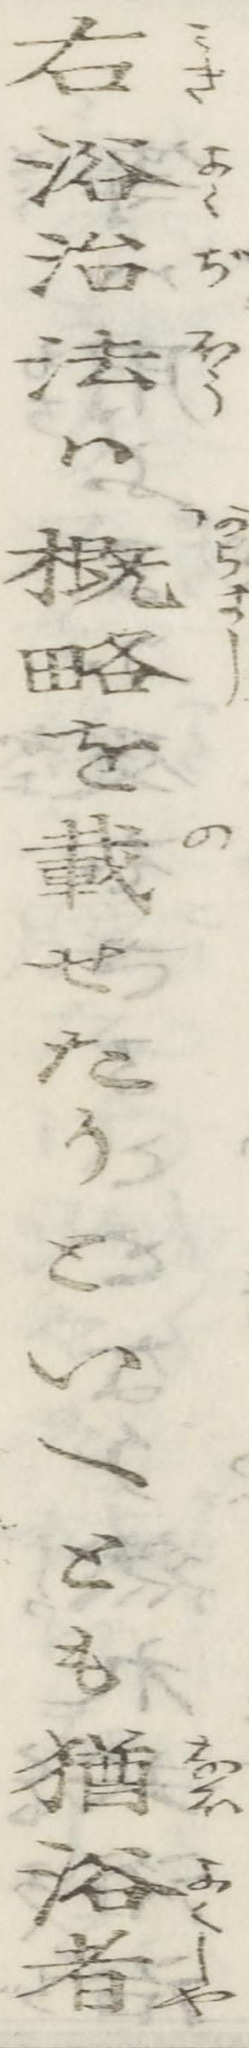右浴治法は概略を載せたりといへとも猶浴者
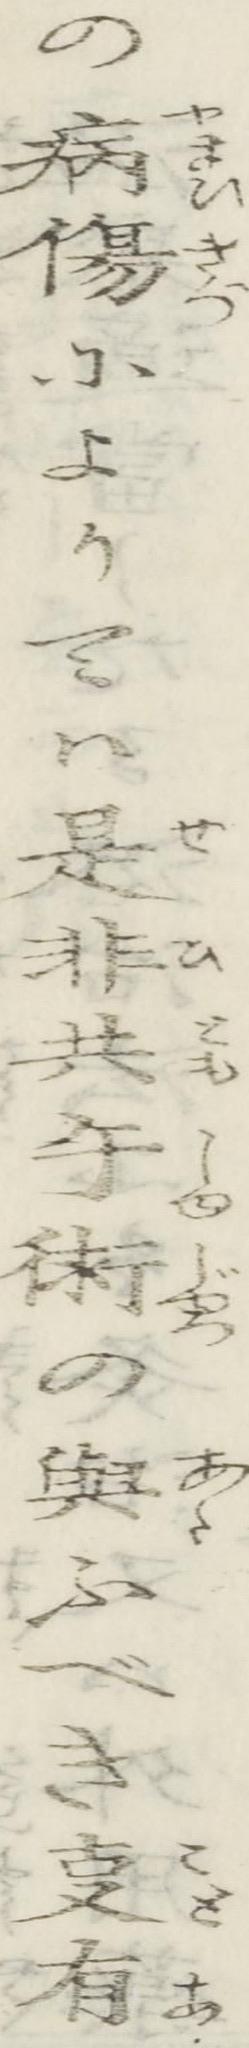の病傷によりては是非共手術の与ふべき事有
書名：鎌先温泉由來記
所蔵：東京大学地震研究所図書室 Earthquake Research Institute Library, The University of Tokyo, JAPAN
